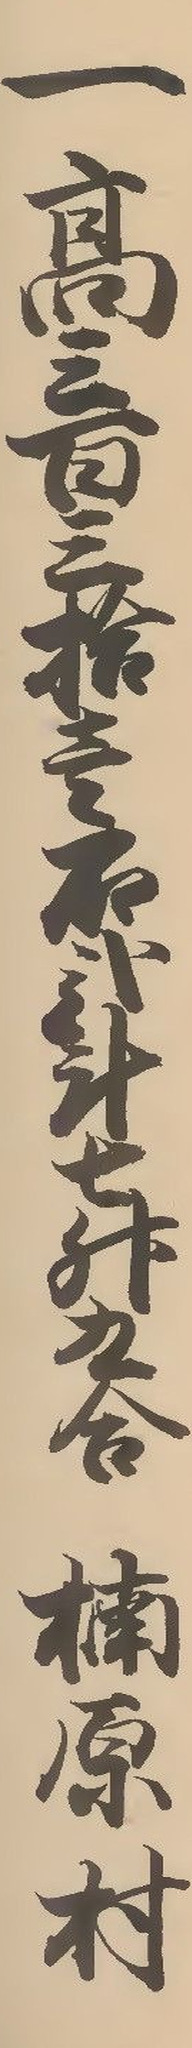一髙三百三拾壱石弐斗七升九合楠原村
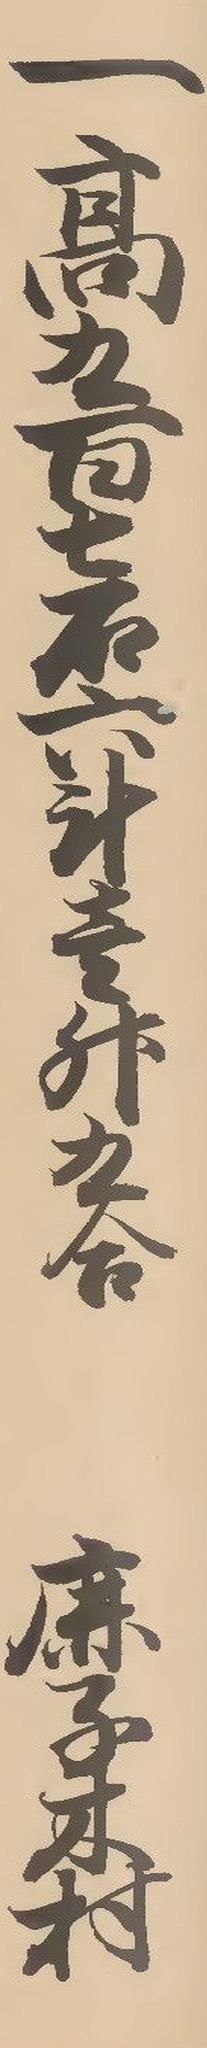一髙九百七石六斗壱升九合鹿子木村
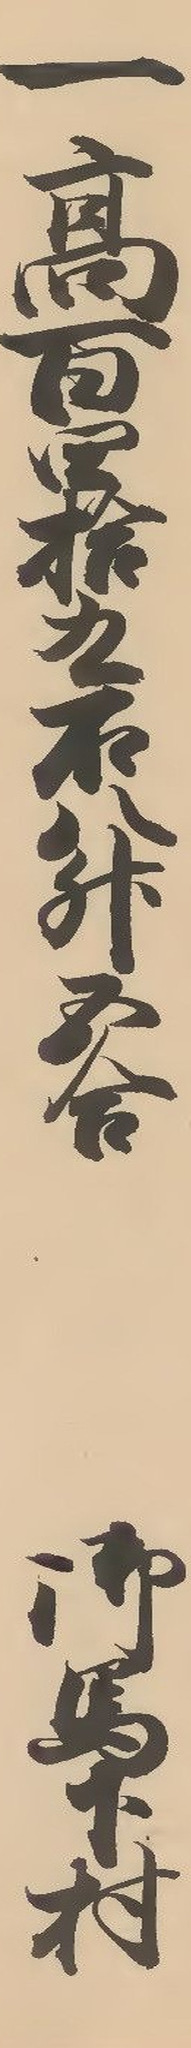一髙百四拾九石八升五合御馬下村
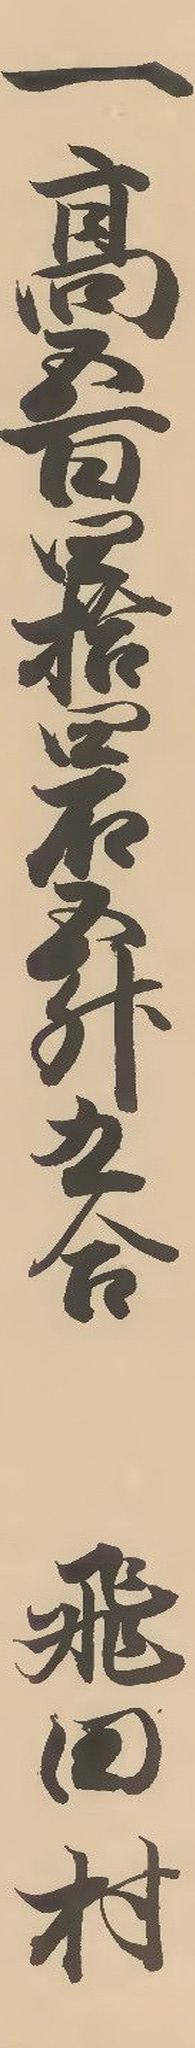一髙五百四拾四石五升九合飛田村
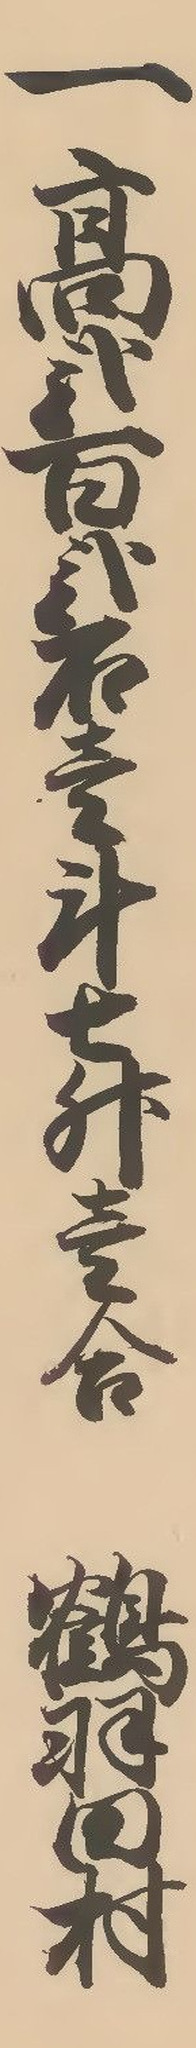一髙弐百弐石壱斗七升壱合鶴羽田村

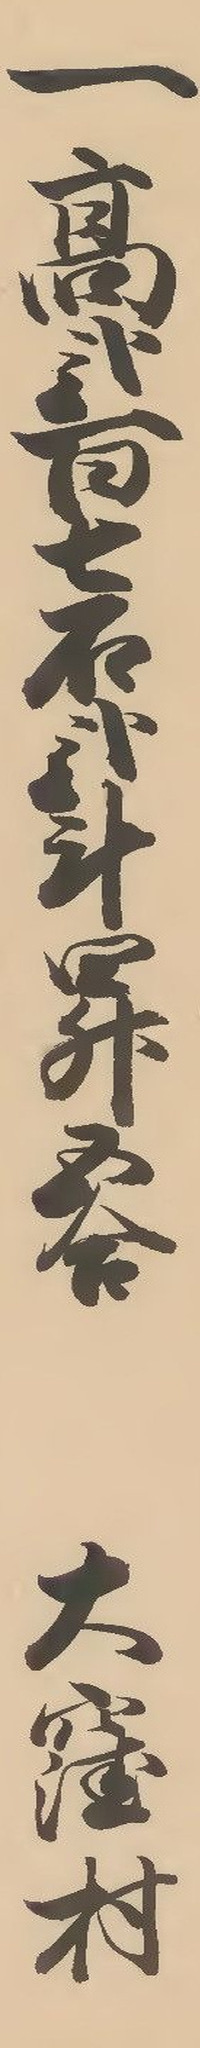一髙弐百七拾弐斗四升五合大窪村
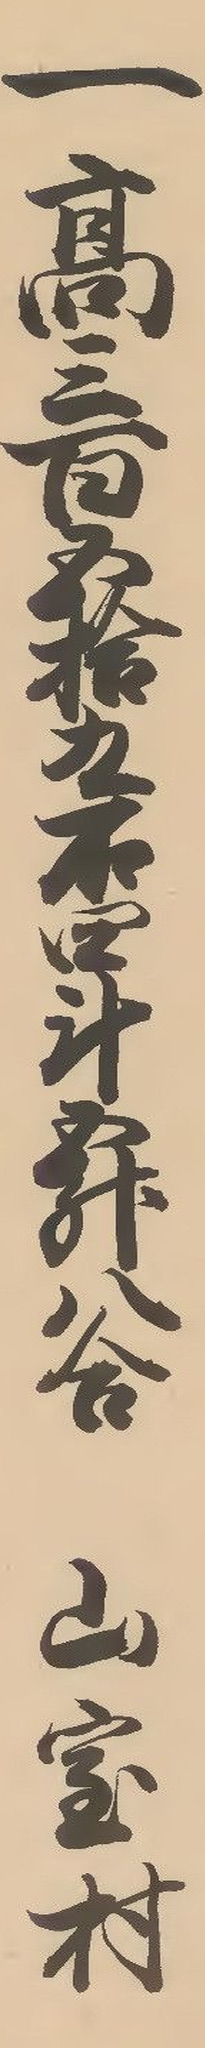一髙三百五拾九石四斗五升八合山室村
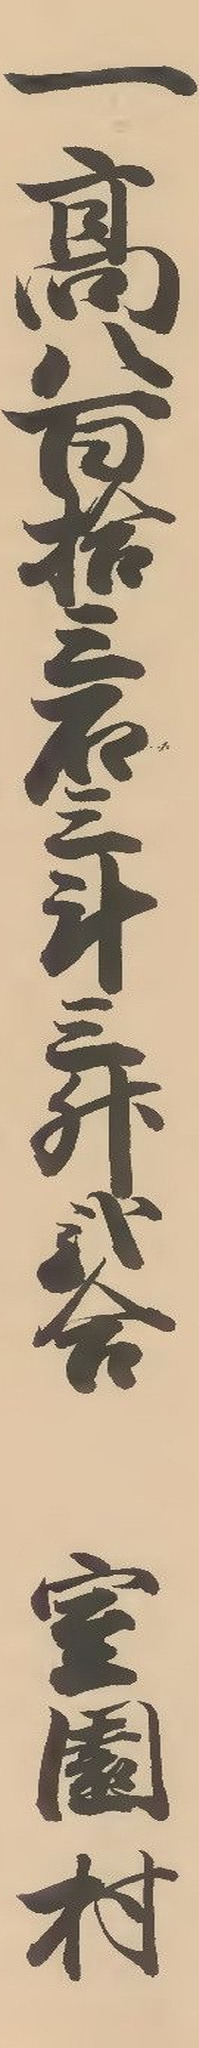一髙八百拾三石三斗三升弐合室園村
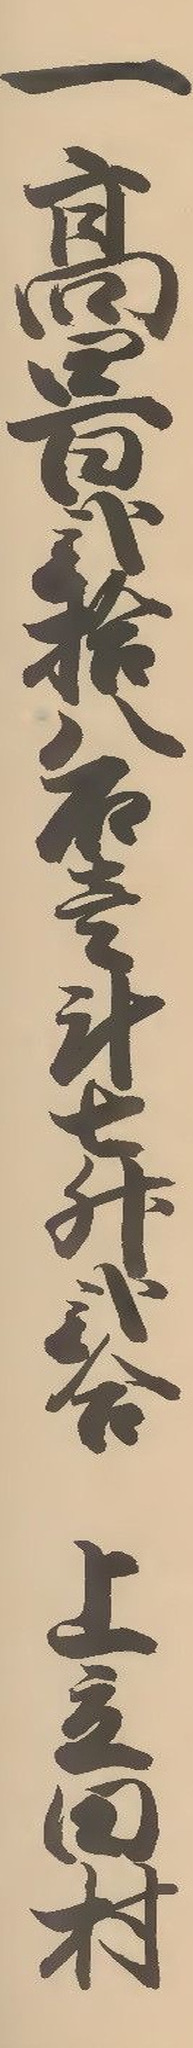一髙四百弐拾八石壱斗七升弐合上立田村
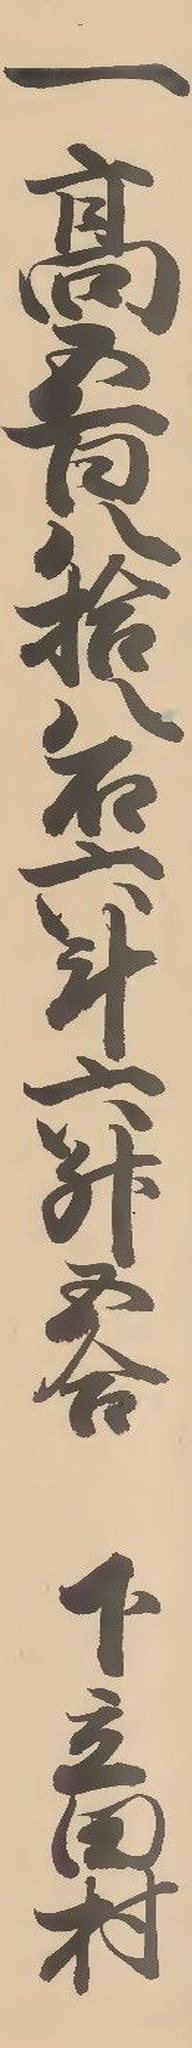一髙五百八拾八石六斗六升五合下立田村
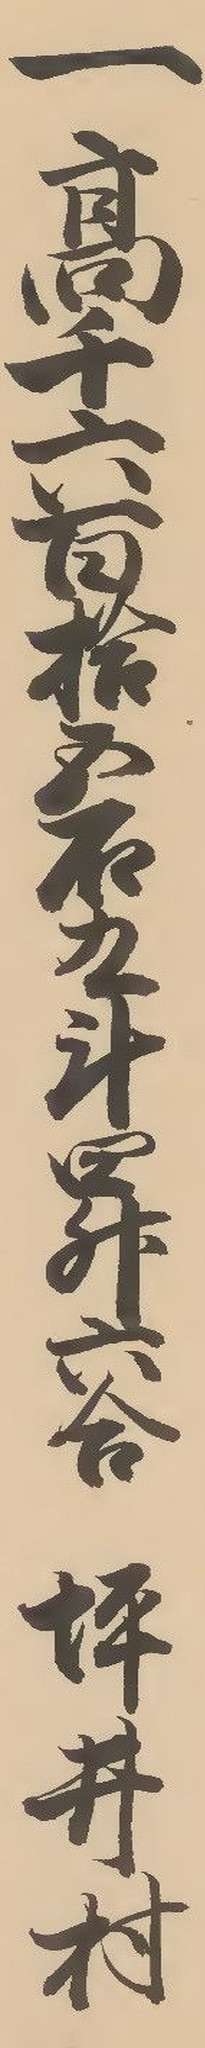一髙千六百拾五石九斗壱升六合坪井村
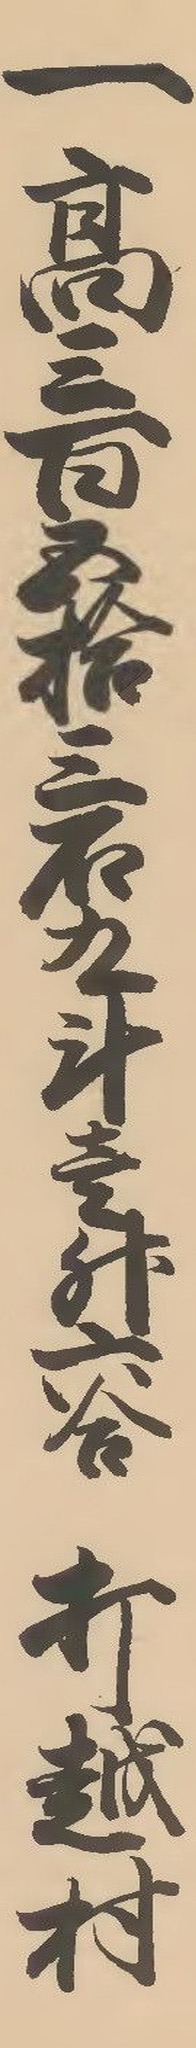一髙三百五拾三石九斗壱升六合打越村
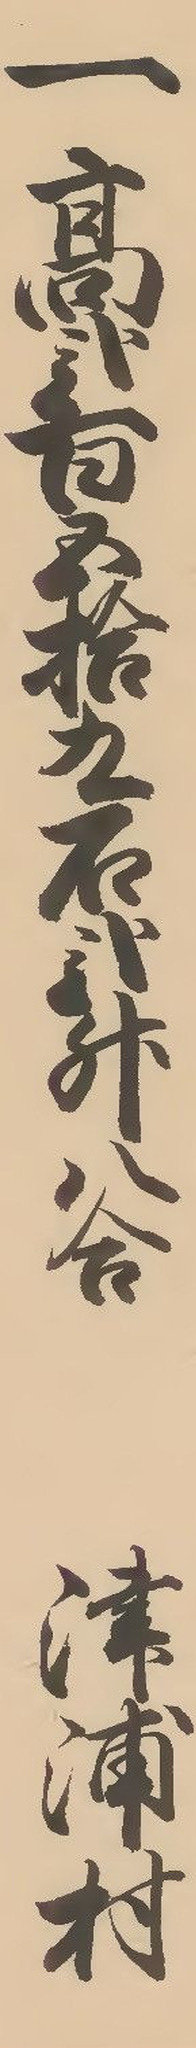一髙弐百五拾九石弐升八合津浦村

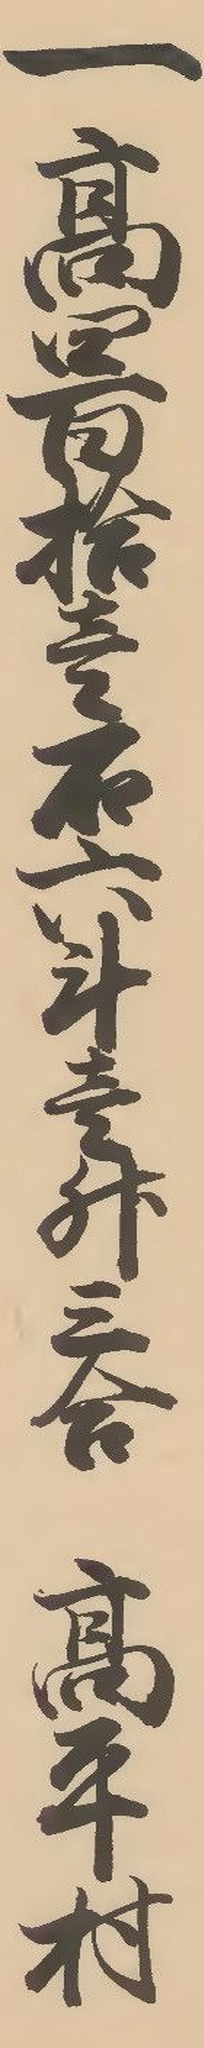一髙四百拾壱石六斗壱升三合髙平村
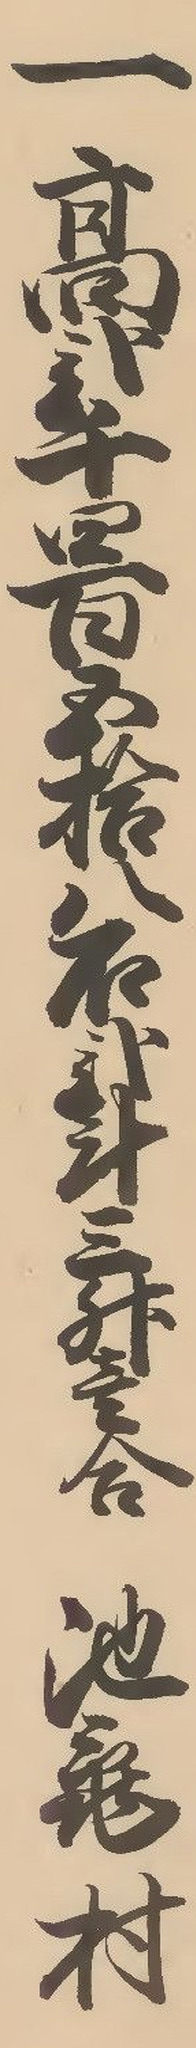一髙弐千四百五拾八石弐斗三升壱合池龜村
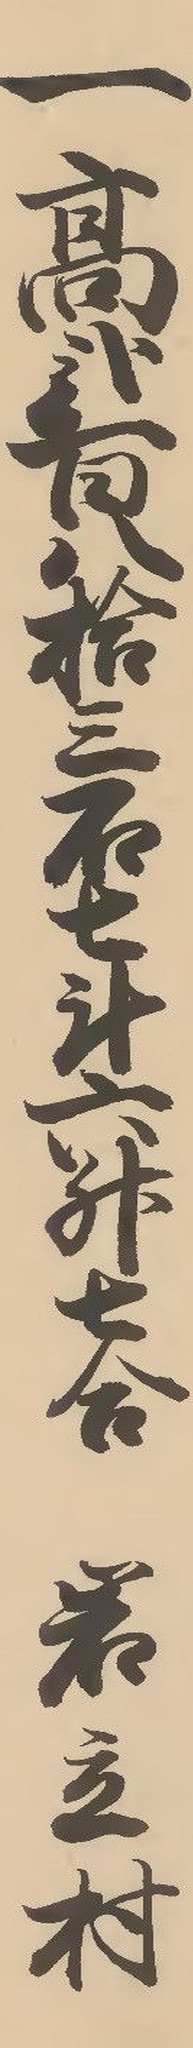一髙弐百八拾三石七斗六升七合岩立村
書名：肥後国郷帳
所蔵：国立公文書館 National Archives of Japan
